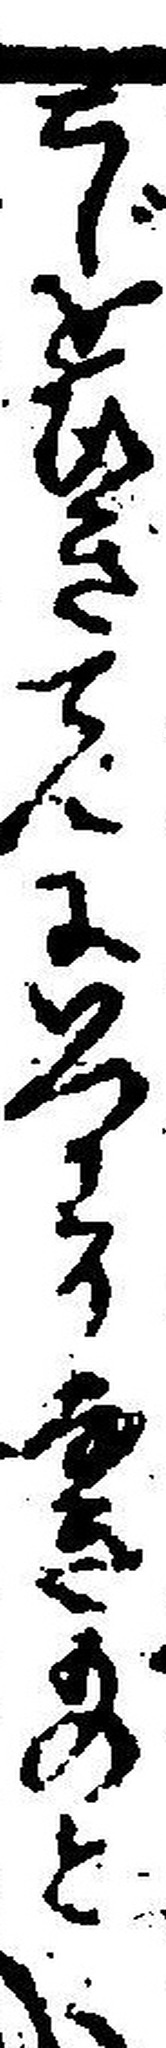こじをひきてんにいつわりなきものと
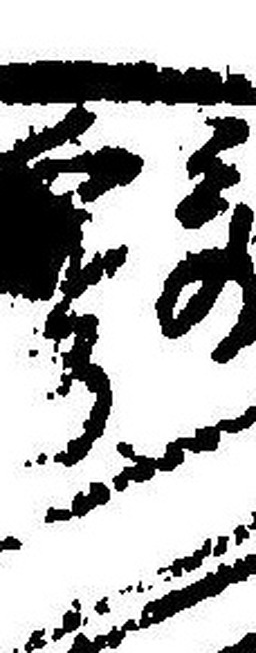くすり
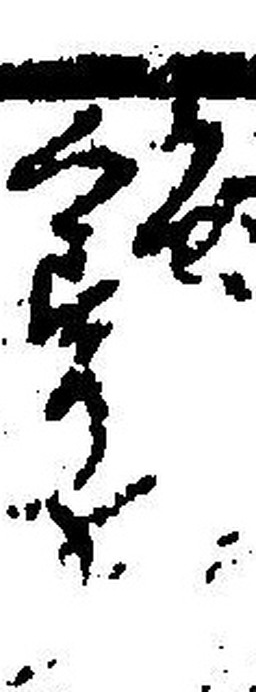くすりを
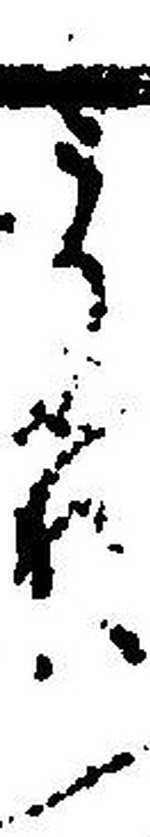うりけれは
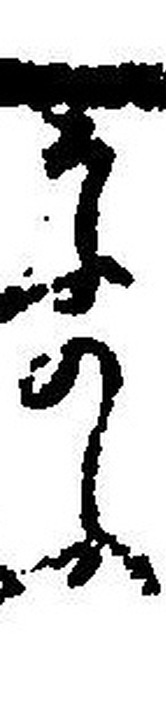かふのふ
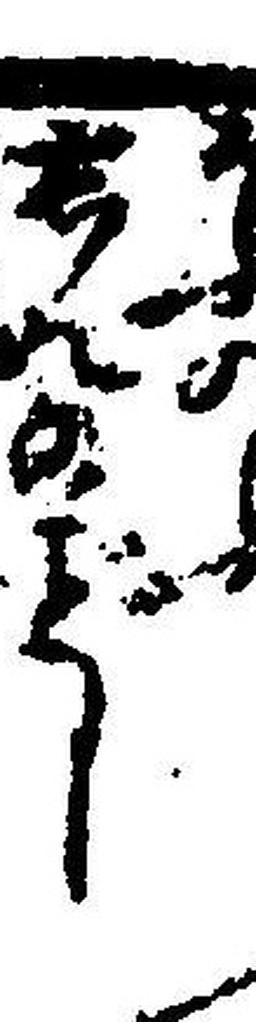しんのごとし
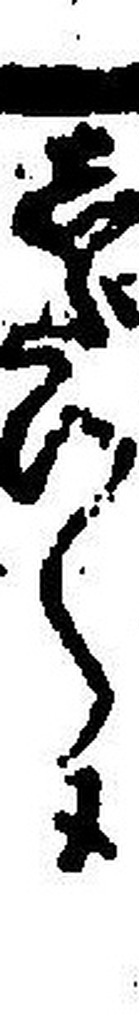しだい〳〵に
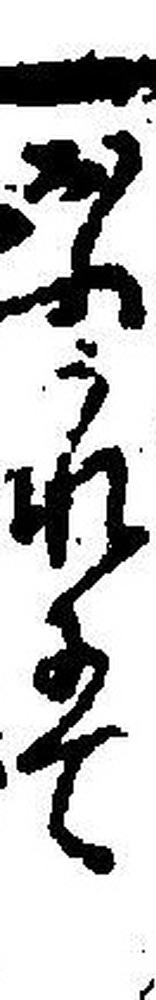おふうれにて
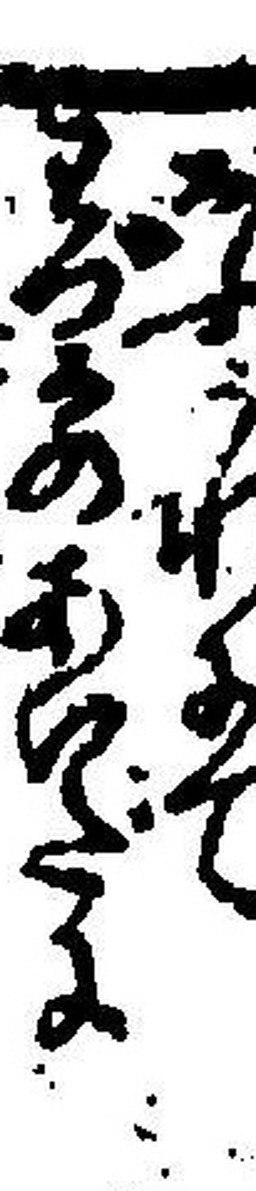わづかのあいだに
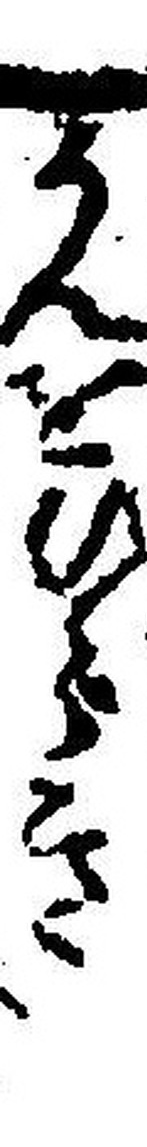うんをひらき
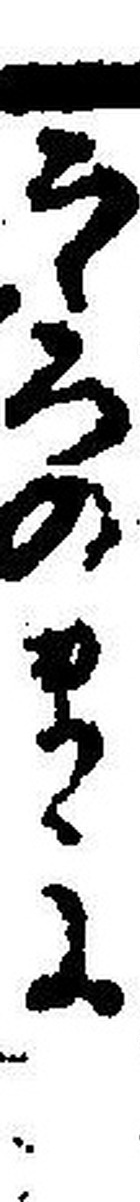こゝろのまゝに
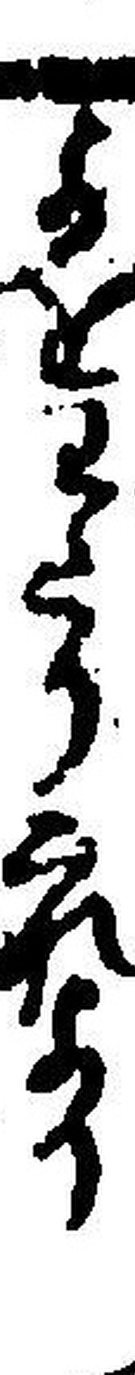よをわたりこれより
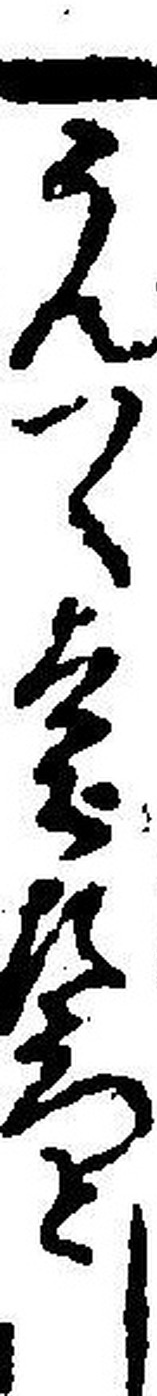うんつく太郎左衛門と
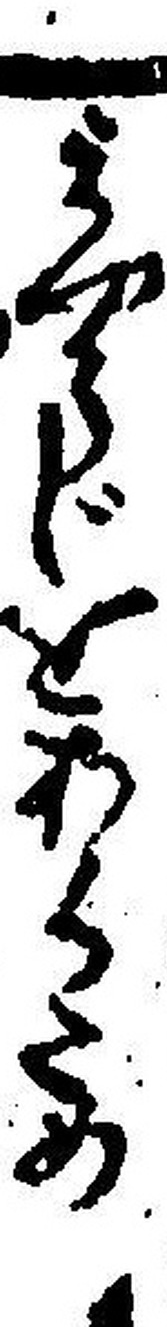みやうじをあらため
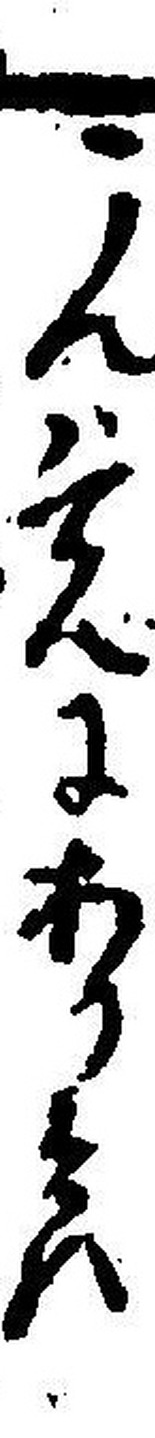うんはてんにありとは
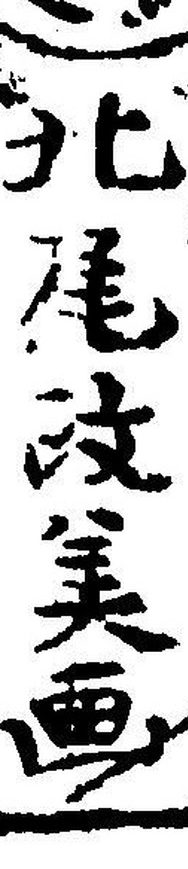北尾政美画
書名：牡丹餅棚有 / 市場通笑作
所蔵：東京大学総合図書館 General Library in the University of Tokyo, JAPAN
